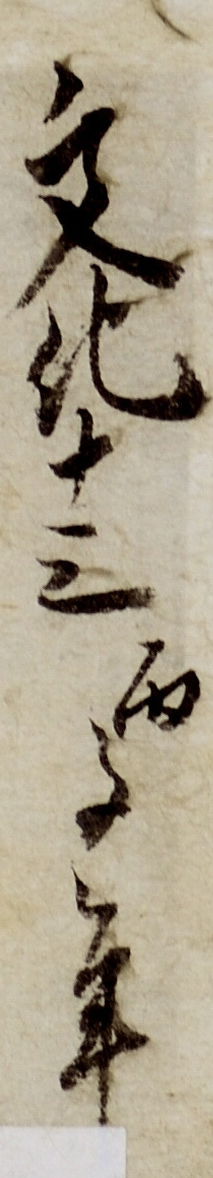文化十三丙子年
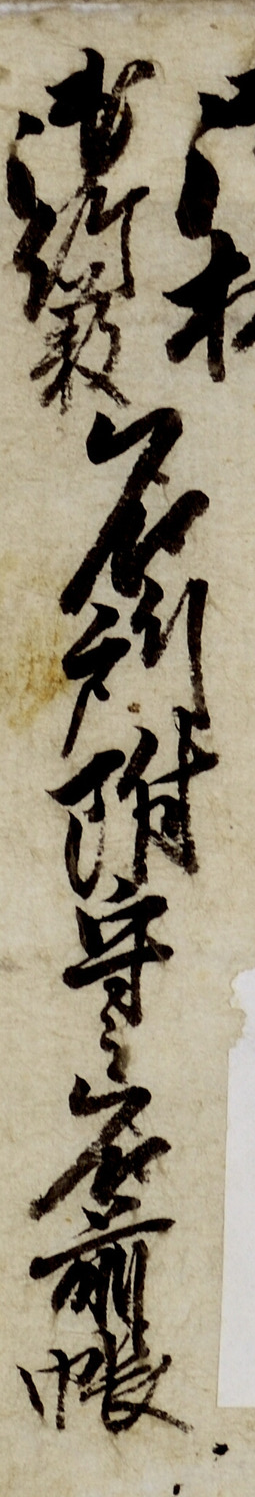御竹藪名所附守之名前帳

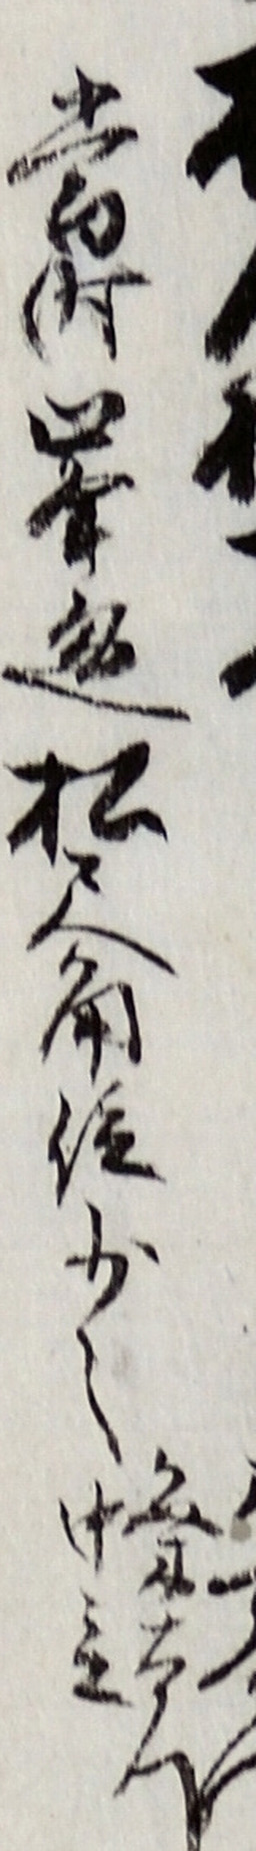当時峯通松尺角位少々中立
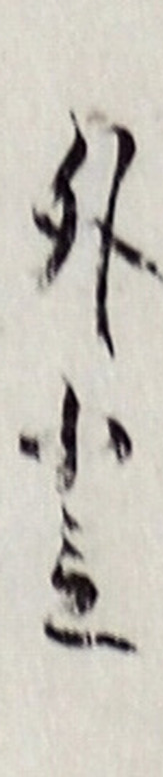外小立
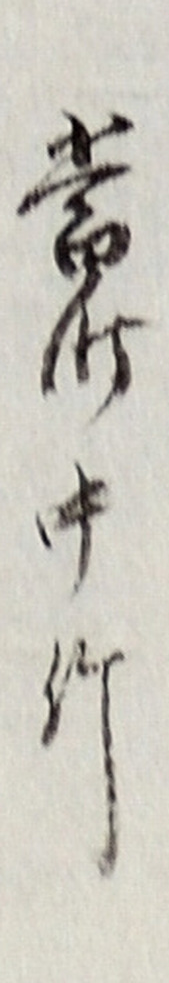当時中竹
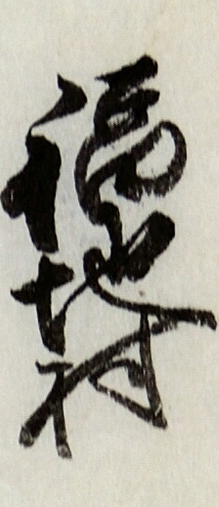福地村
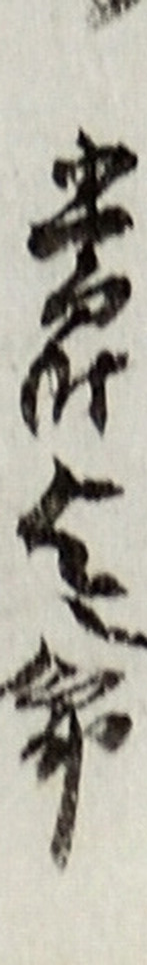当時嘉十郎
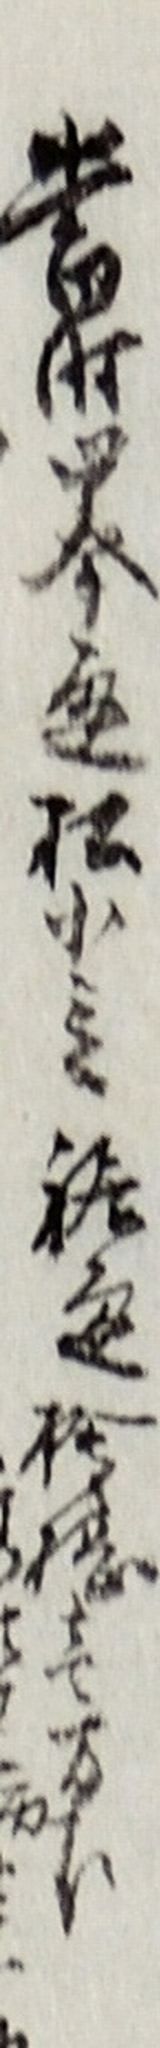当時峯通松小立裾通檜椹壱万本
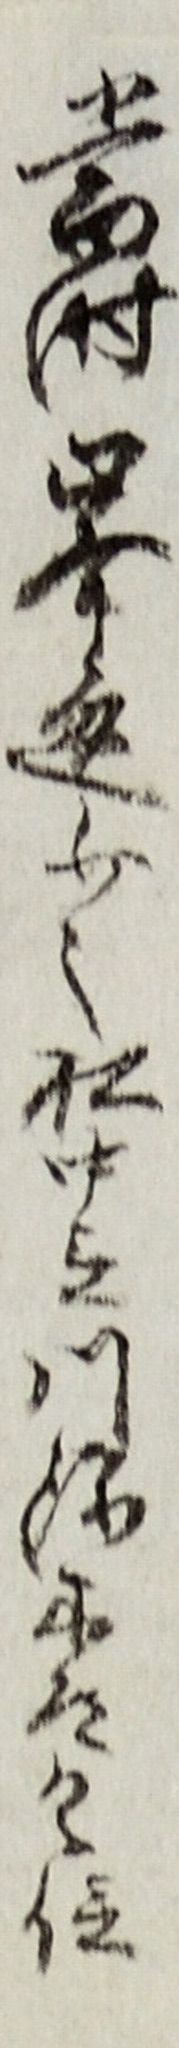当時峯通少々松中立川添木道具位
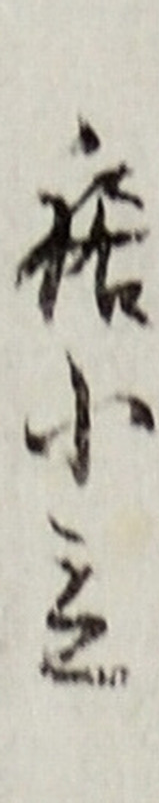裾小立
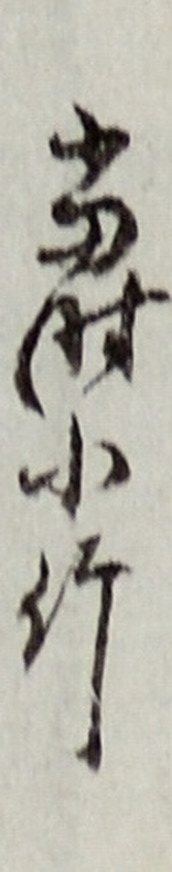当時小竹

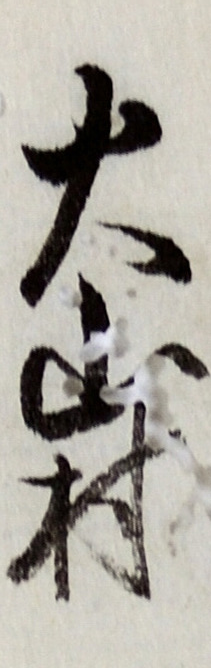火山村
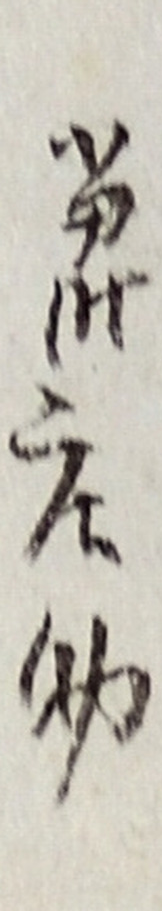当時庄助
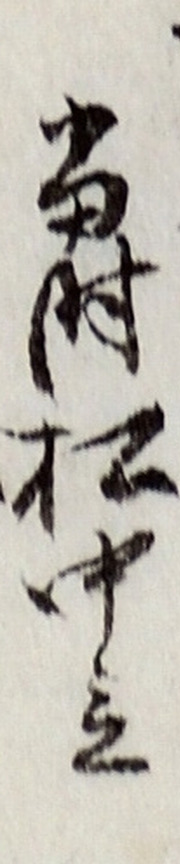当時松中立
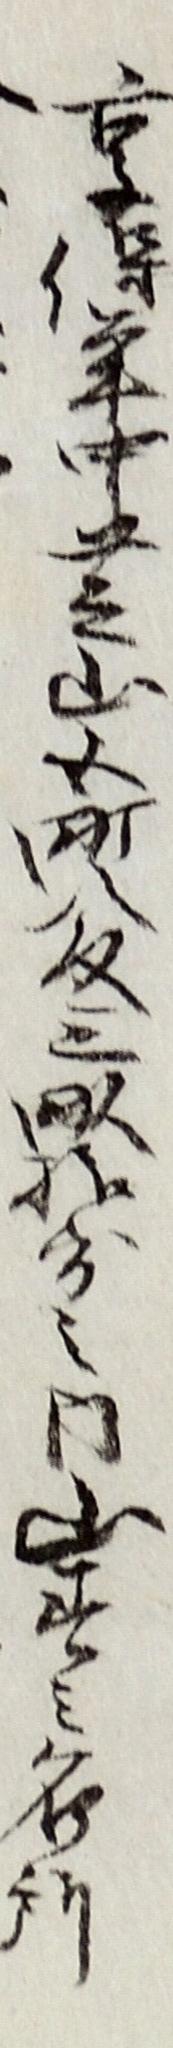享保年中芝山五町八反三畝拾歩之内山すみ名所
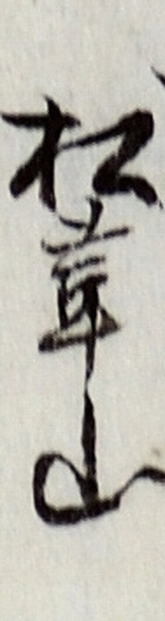松茸山
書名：郷中御林御竹薮名所附守之名前帳
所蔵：伊那市立高遠町図書館・合同会社AMANE
